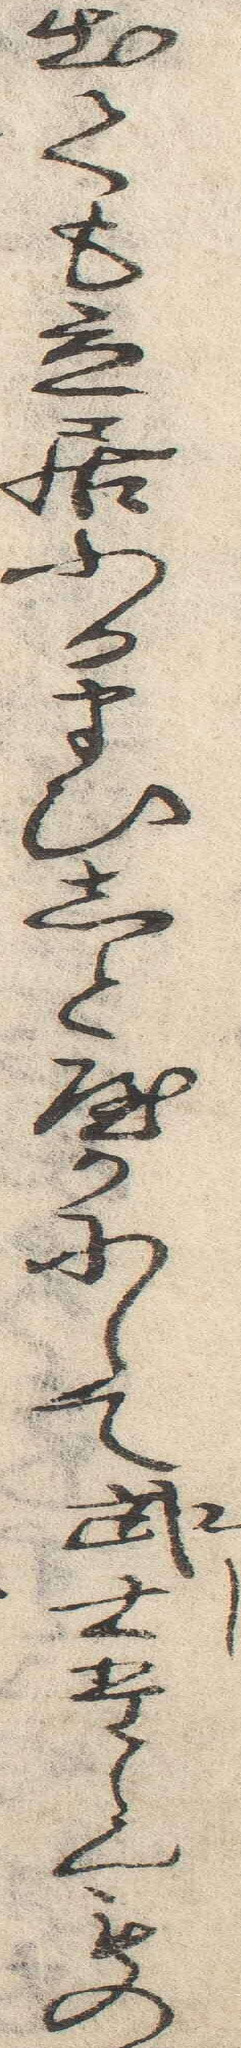出ても立居ふるまひしとやかにして武士たらんもの
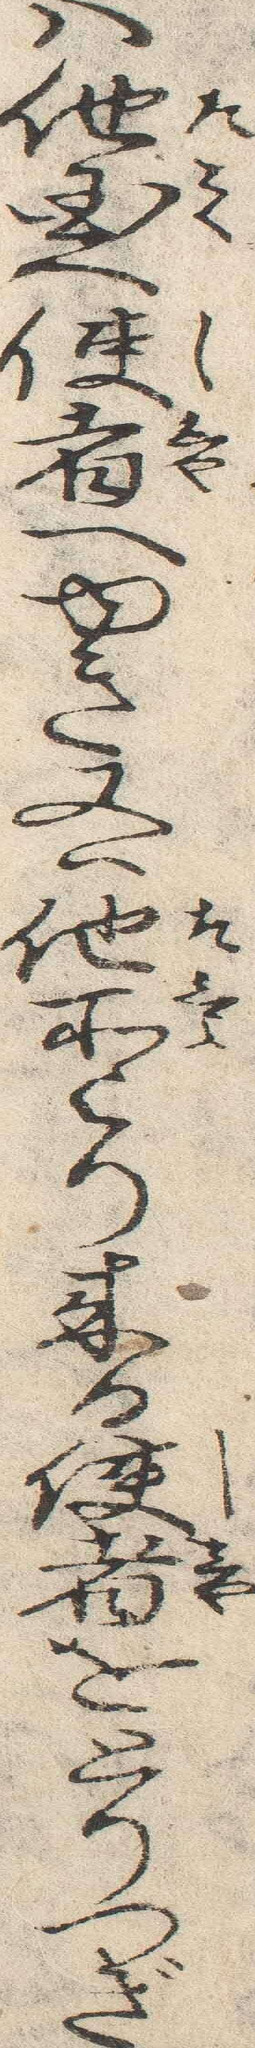は他国へ使者へゆき又は他所より来る使者をとりつぎ
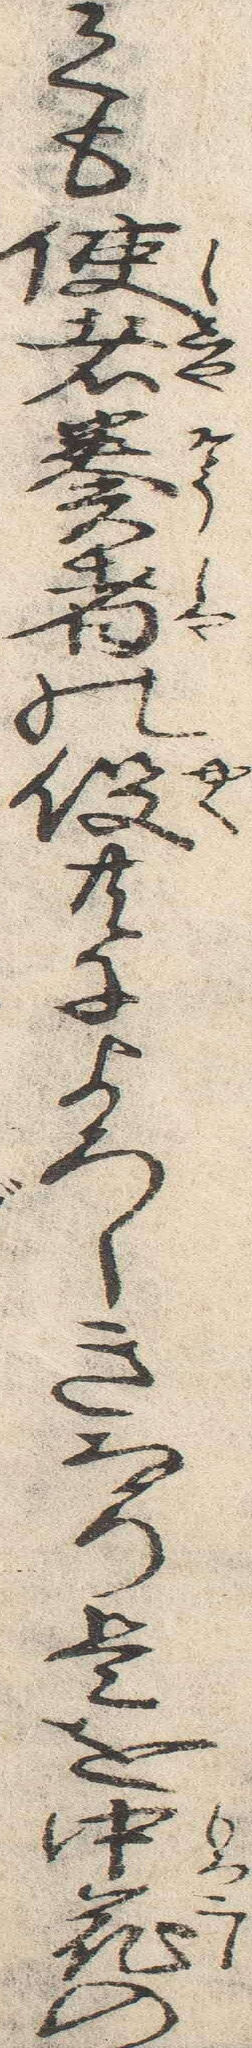ても使者奏者の役共によろしきなり是を中花の
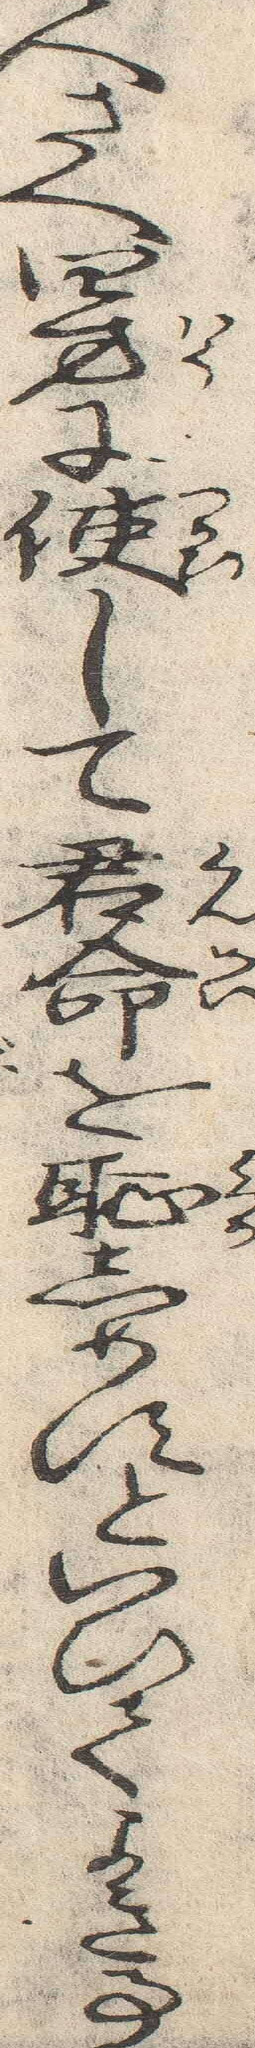人さへ四方に使して君命を恥しめすといひてよき事
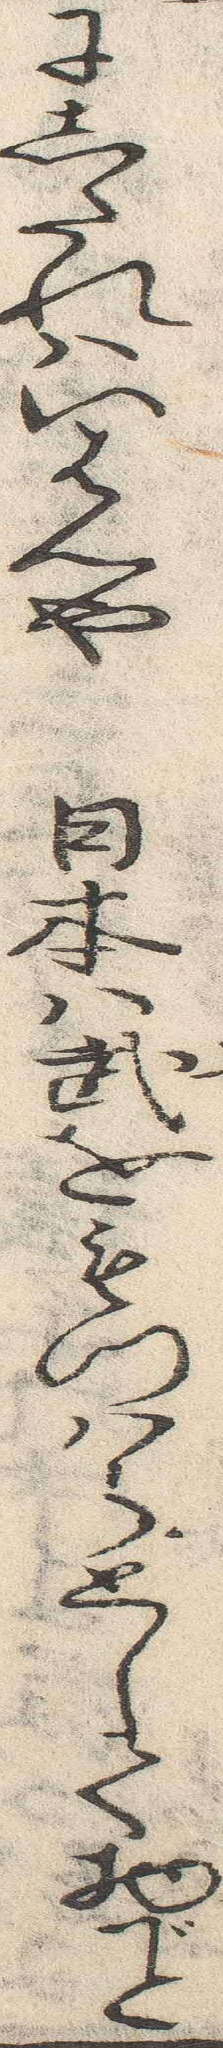にしたれはいはんや日本は武をもつはらとして物ごと
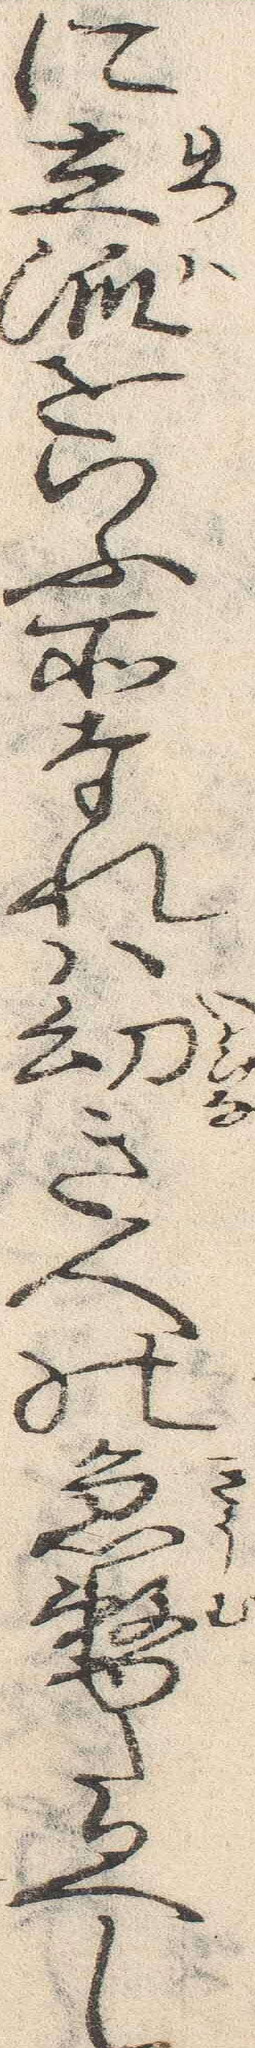に立派をいふ所なれは幼き人の急務たるへし
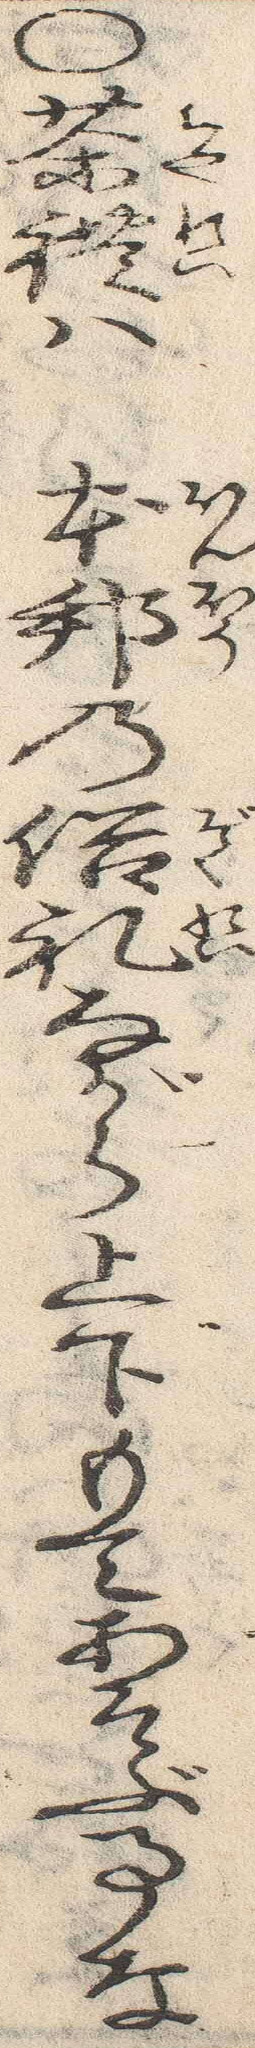○茶礼は本邦の俗礼ながら上下もてあそぶ事な
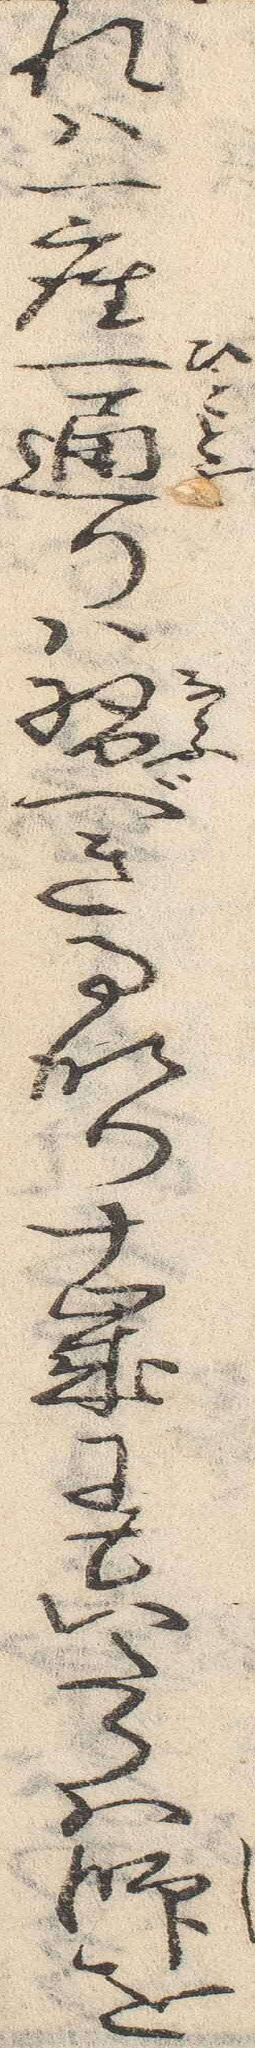れは一座一通りは習べき事なり十歳にもいたらは師を

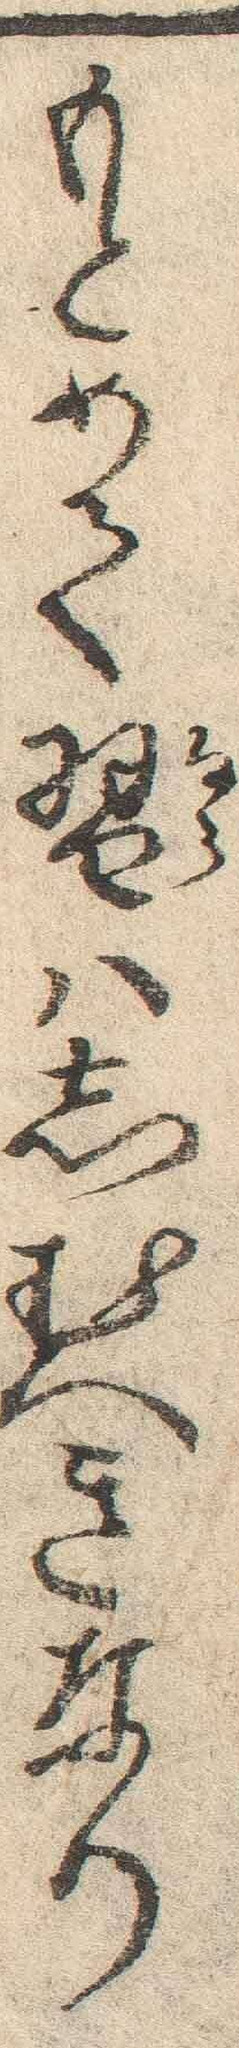もとめて習はしむへきなり
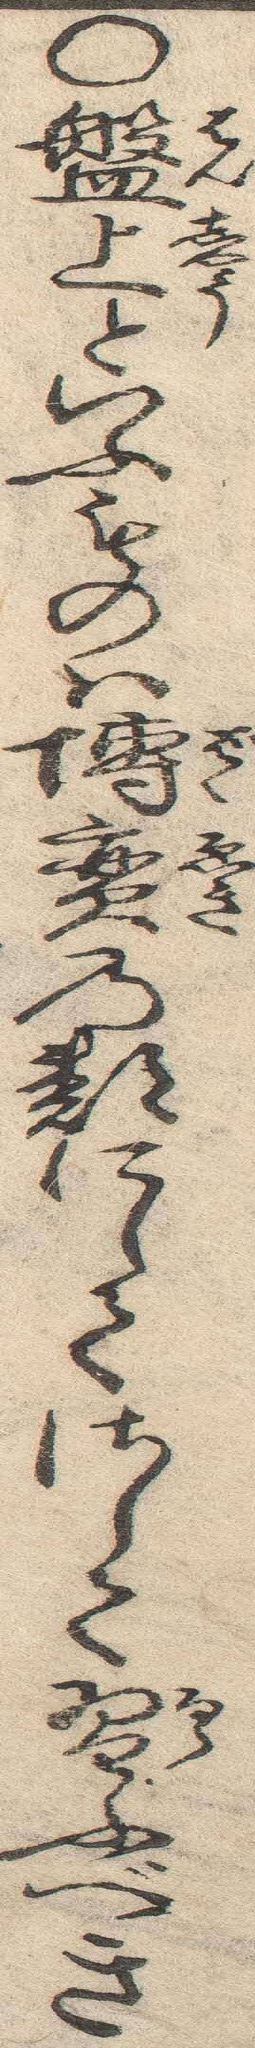○盤上といふものは博奕の類にしてさして習ふべき
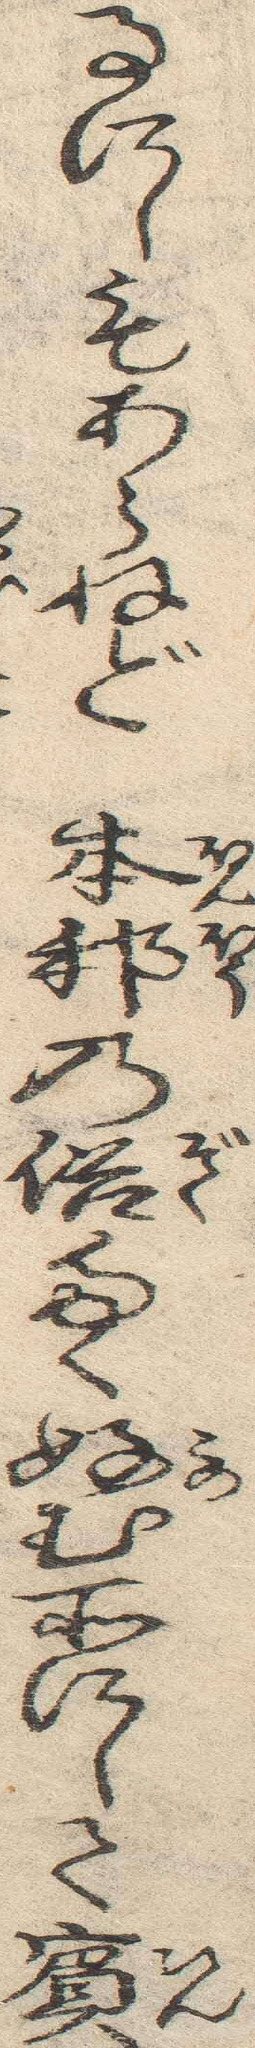事にしもあらねど本邦の俗多く好む所にして賓
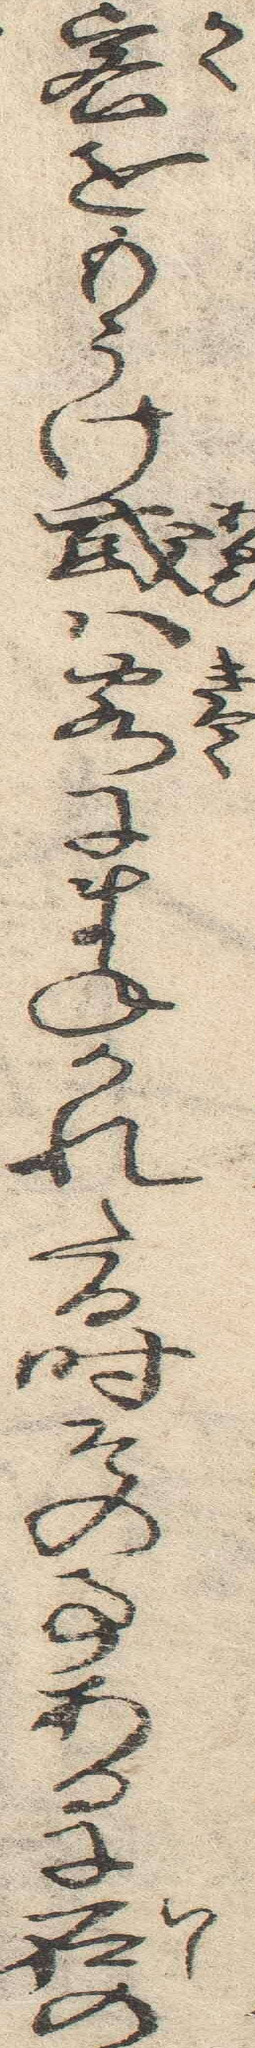客をもうけ或は客にまねかれたる時その事あるに石の
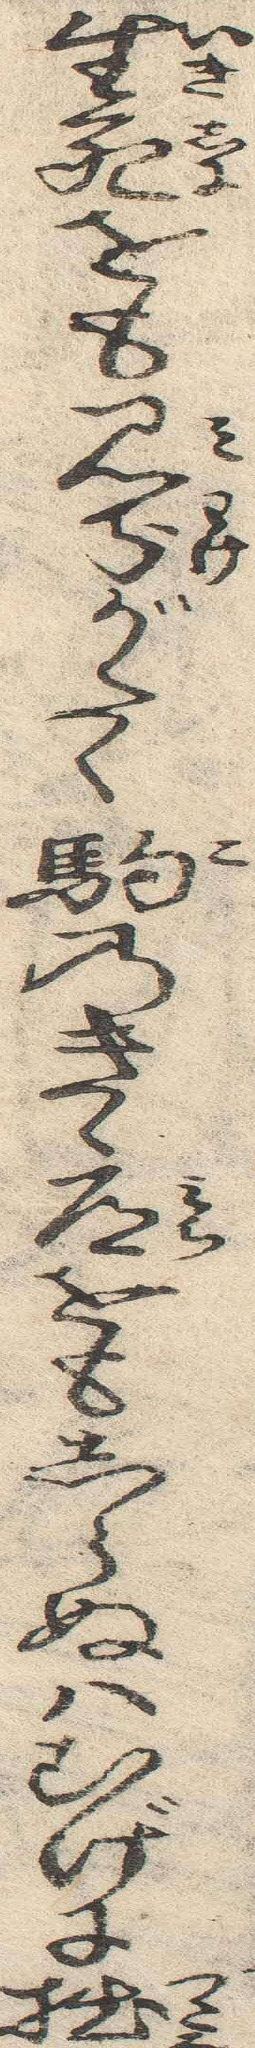生死をも見分がたく駒のきゝ道をもしらぬはむげに拙
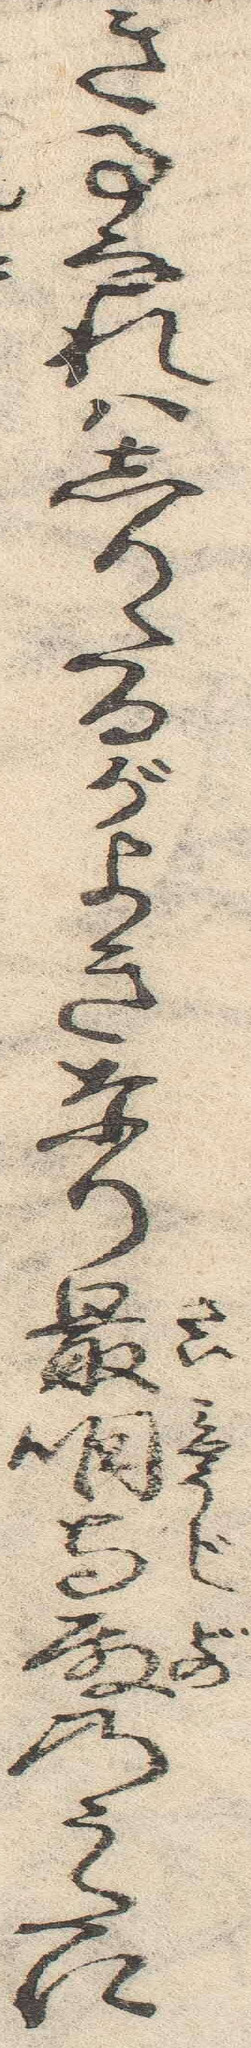き事なれはしりたるがよきなり最明寺殿のうたに
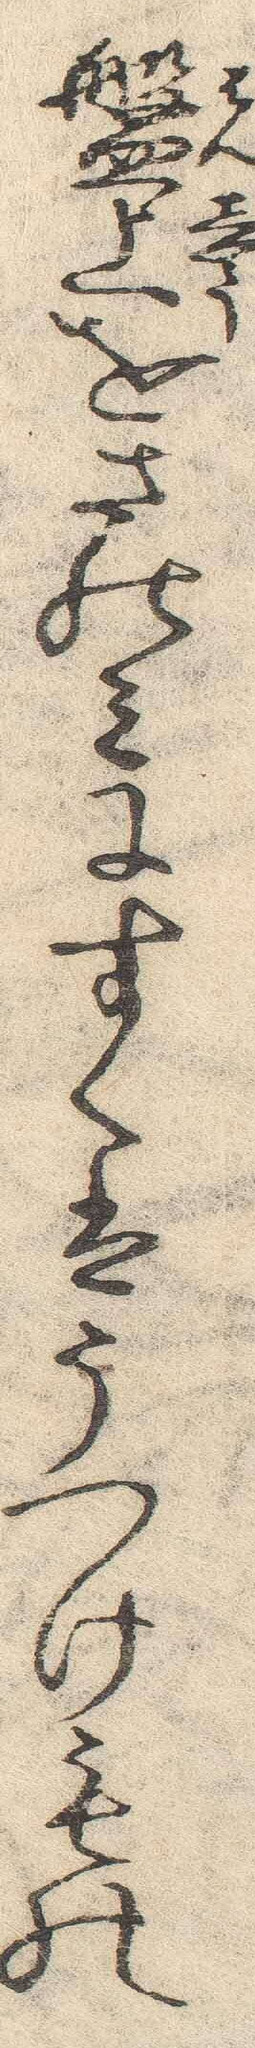盤上をさのみにすくはうつけもの
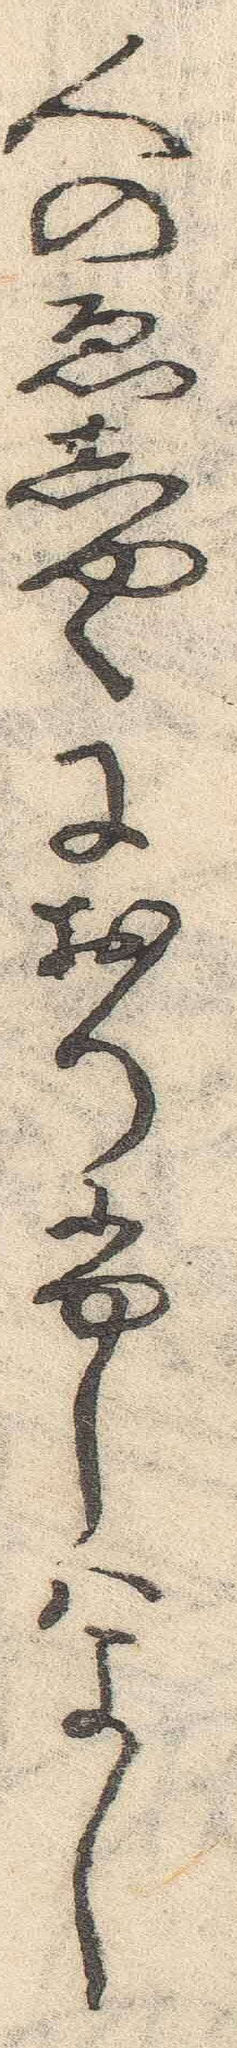人のゑしやくにおりふしはよし
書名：小児必用養育草
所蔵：東京学芸大学附属図書館 国文学研究資料館
